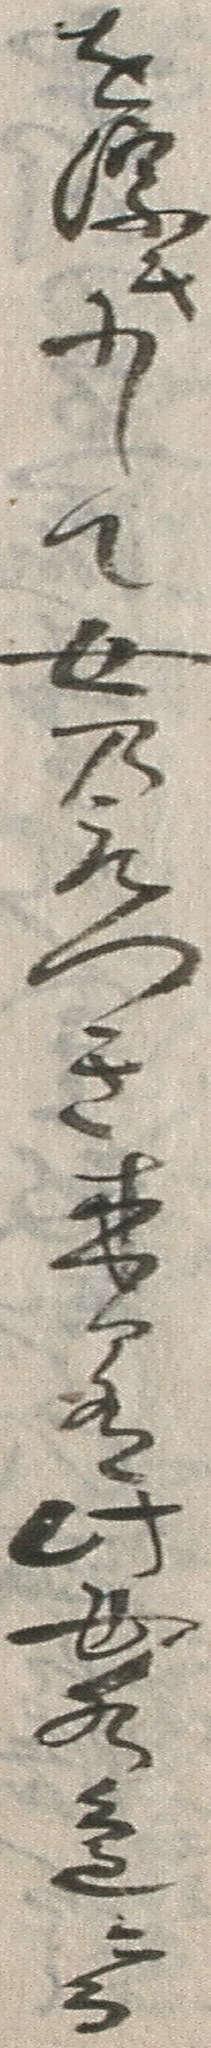を浮きにして女の取つき来る有此女水辺にて
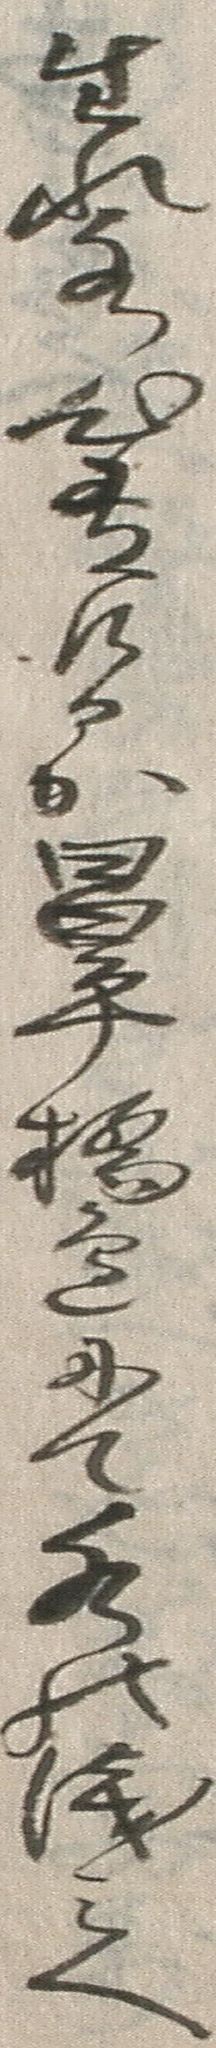生れなり心有けるか昌平橋辺にて水の浅みへ
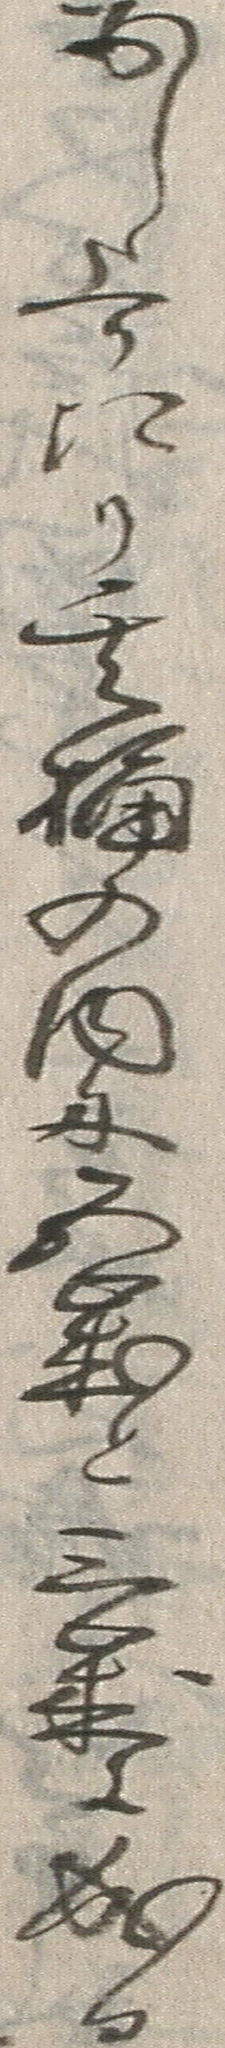おし上りたり其桶の内に五歳と三歳に成る
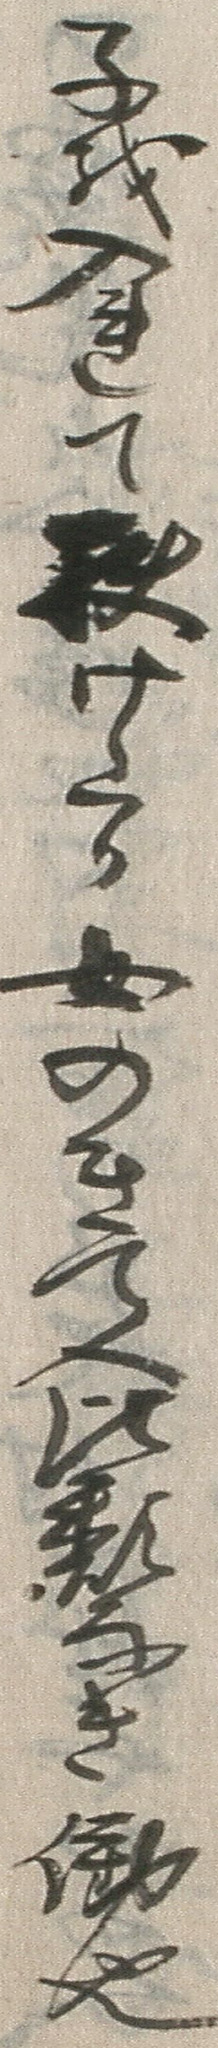子を入れて扶けたり女のきてん比類なき働也
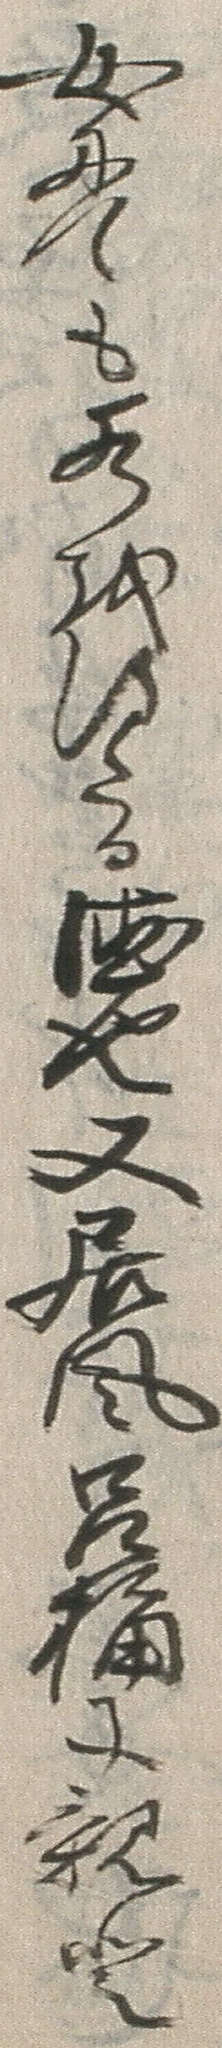女にても水を得たる徳也又居風呂桶に親と
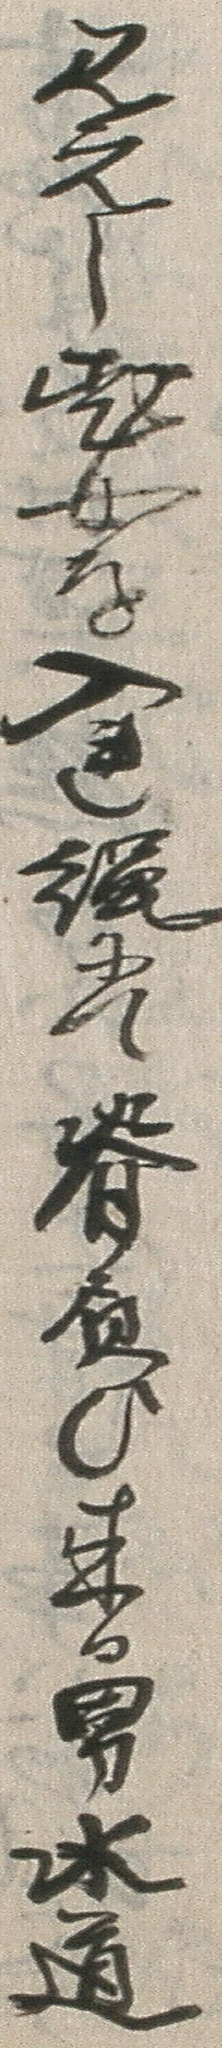見えし老女を入れ縄にて背負ひ来る男水道
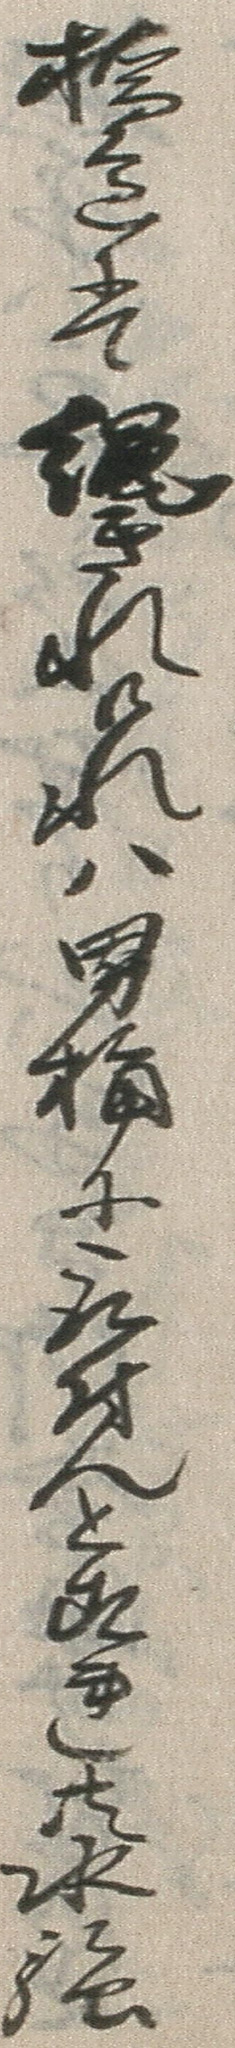橋辺にて縄きれけれは男桶に取付んとすれ共水強
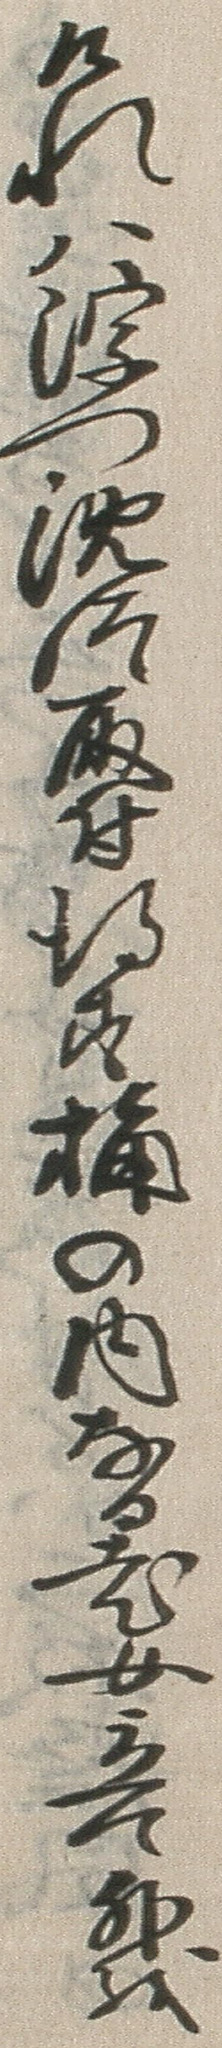けれは浮つ沈つ取付得す桶の内の老女立て外を
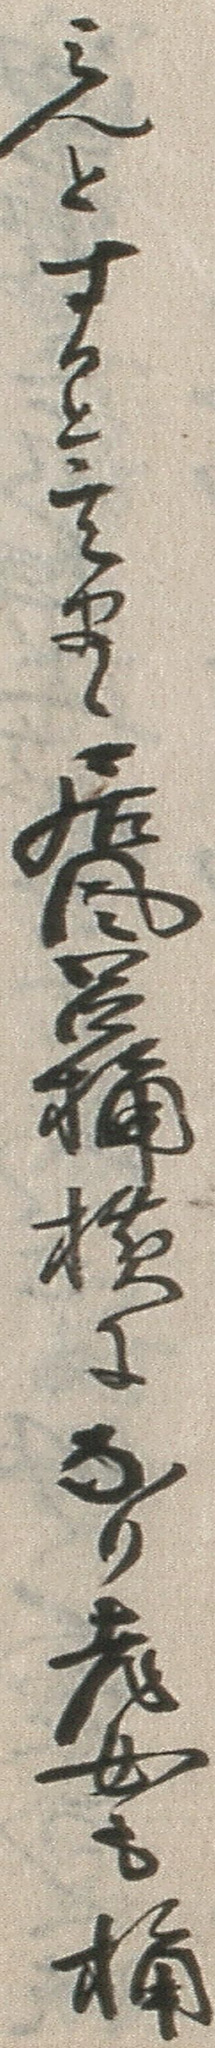みんとすると其まゝ居風呂桶横になり老女も桶
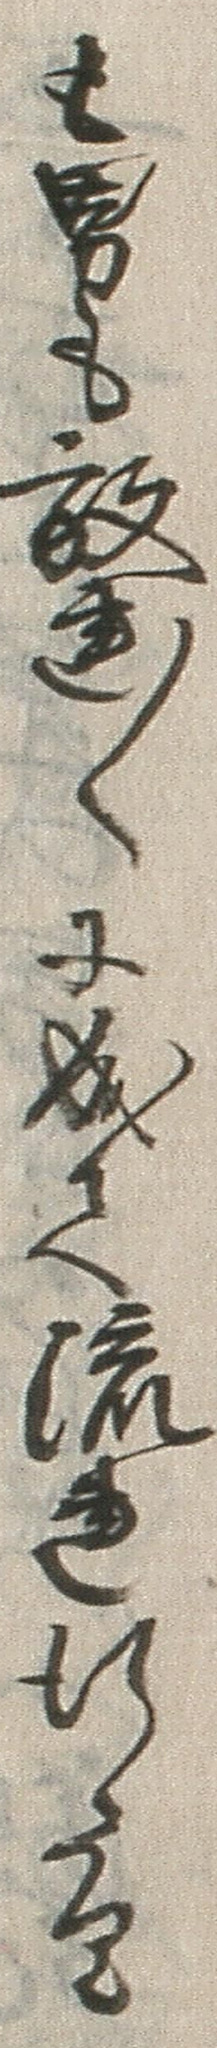も男も放れ〳〵に成て流れ行たる也
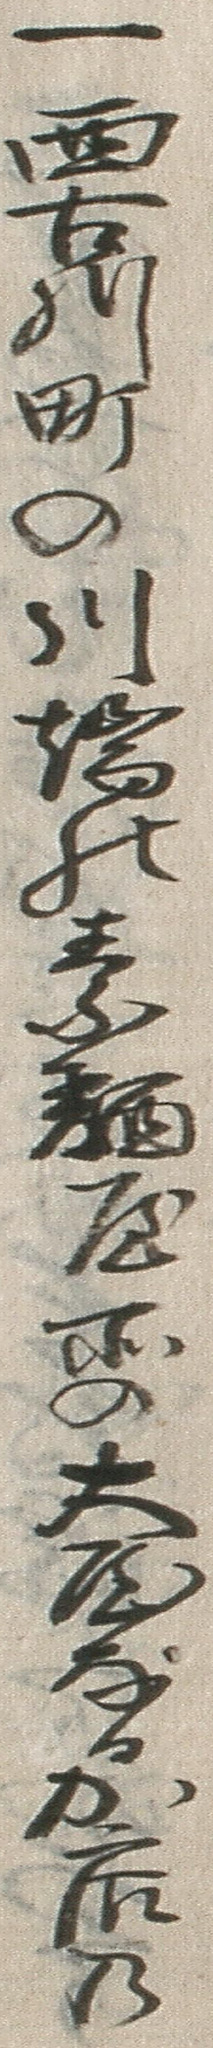一西古川町の川端の素麺屋所の大屋なるか店の
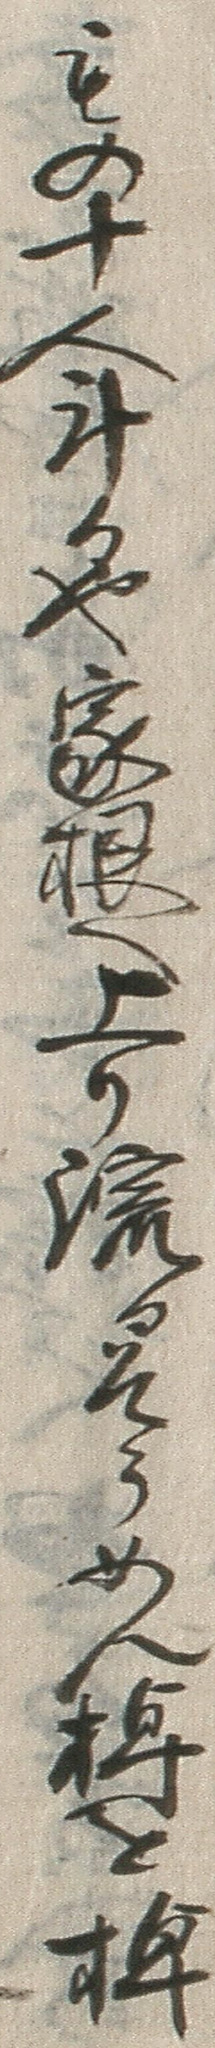もの十人斗かや家根へ上り流るそうめん棹を棹
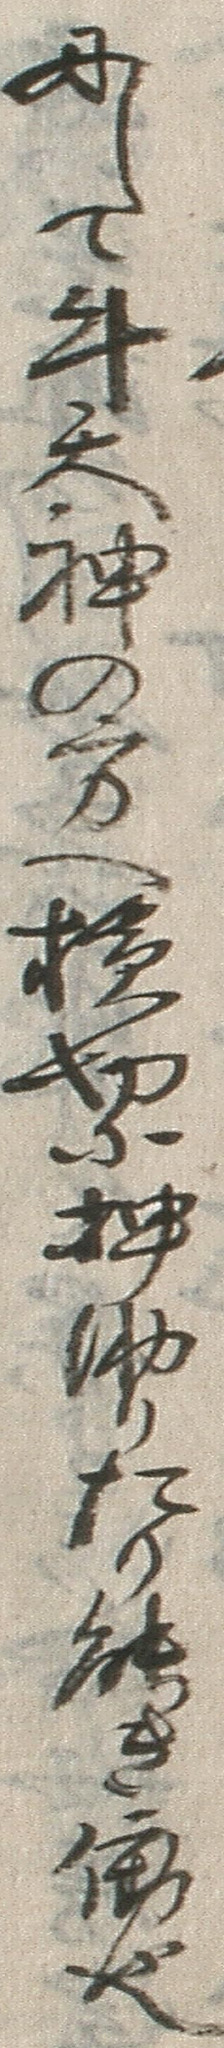にして牛天神の方へ横切に押助りたり能き働也
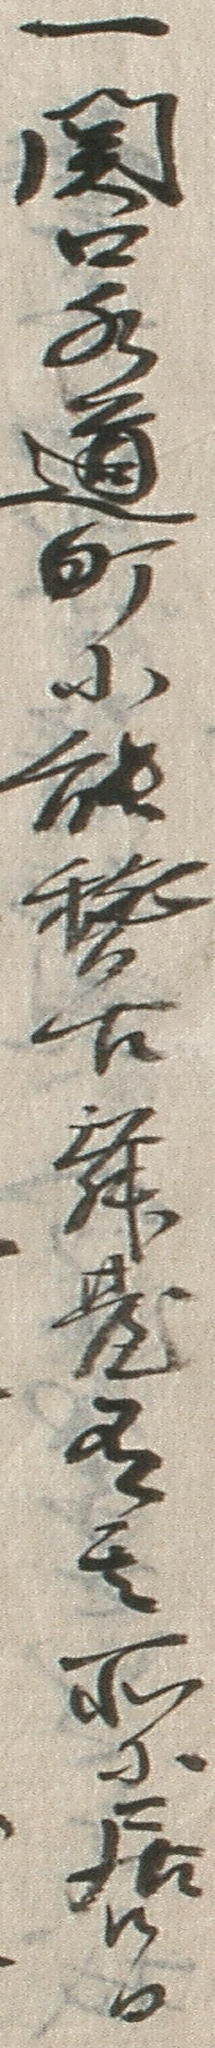一関口水道町に能稽古舞台有其所に居ける
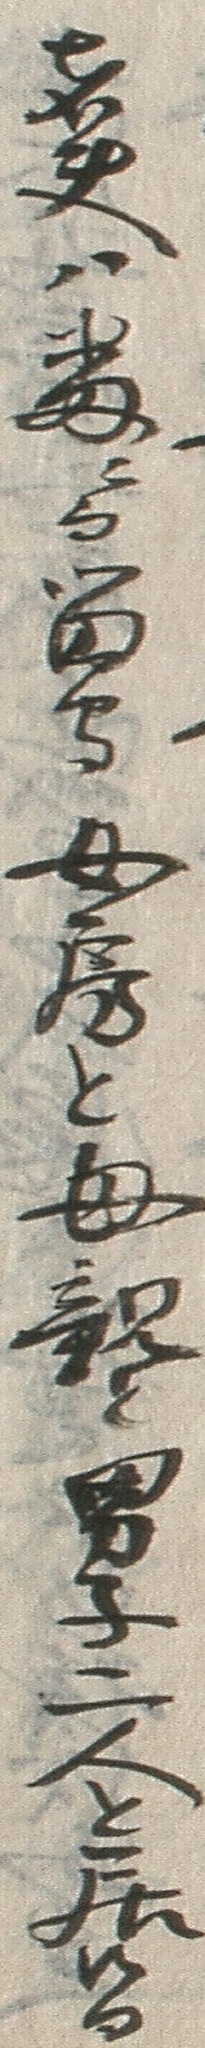か夫は番にて留守女房と母親と男子二人と居ける
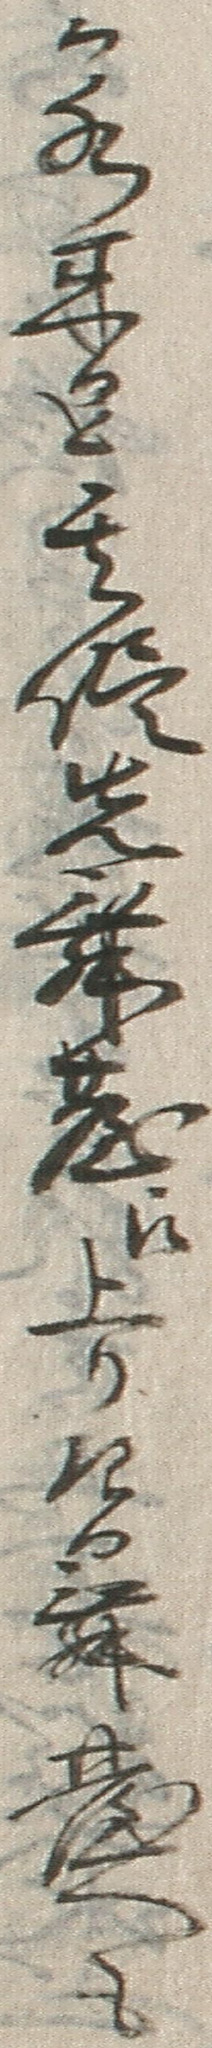か水来ると其侭先舞台え上りける舞台へも
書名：享保十三年江戸洪水記
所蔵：東京大学地震研究所図書室 Earthquake Research Institute Library, The University of Tokyo, JAPAN
